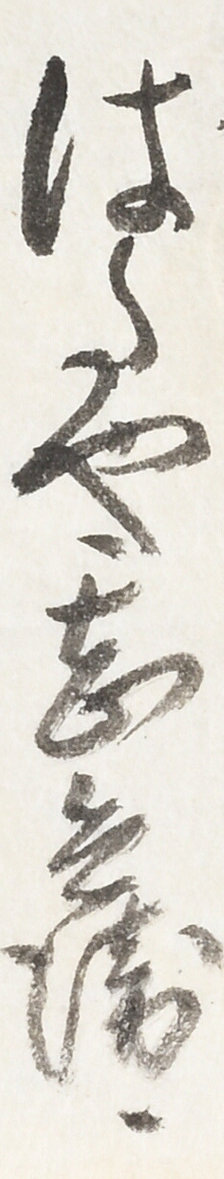一はたや甚兵衛・
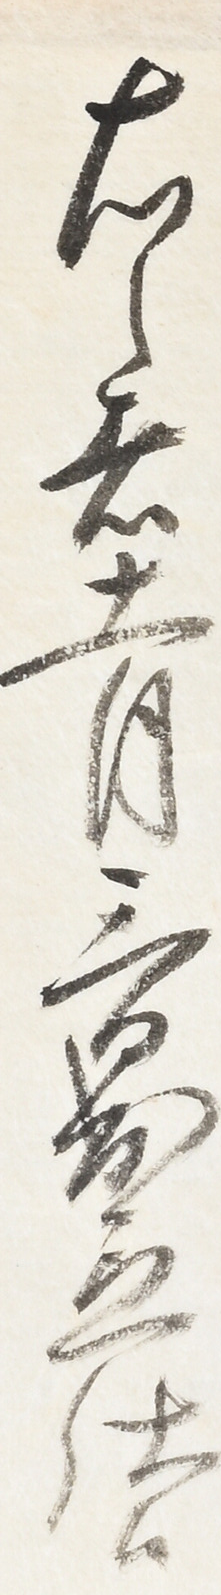右之者十一月三日出立仕候
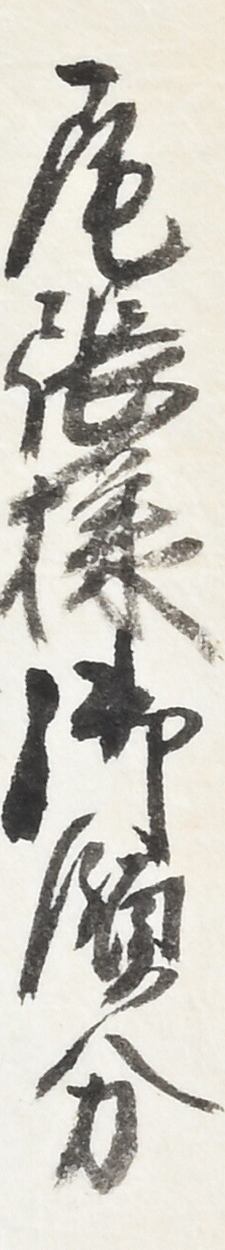尾張様御領分
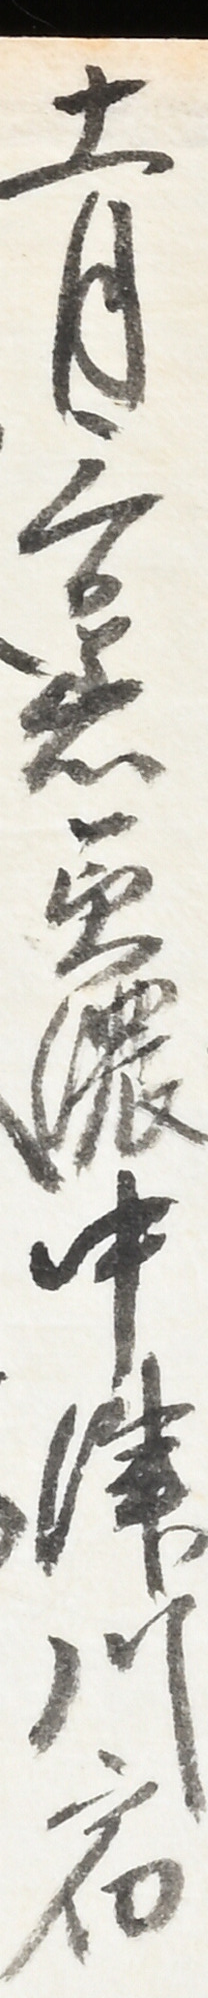十一月三日着美濃中津川宿
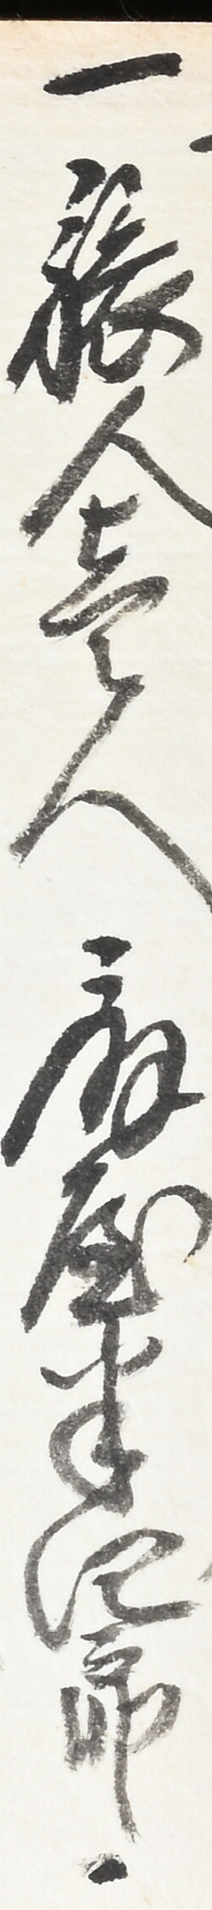一旅人壱人扇屋半四郎・
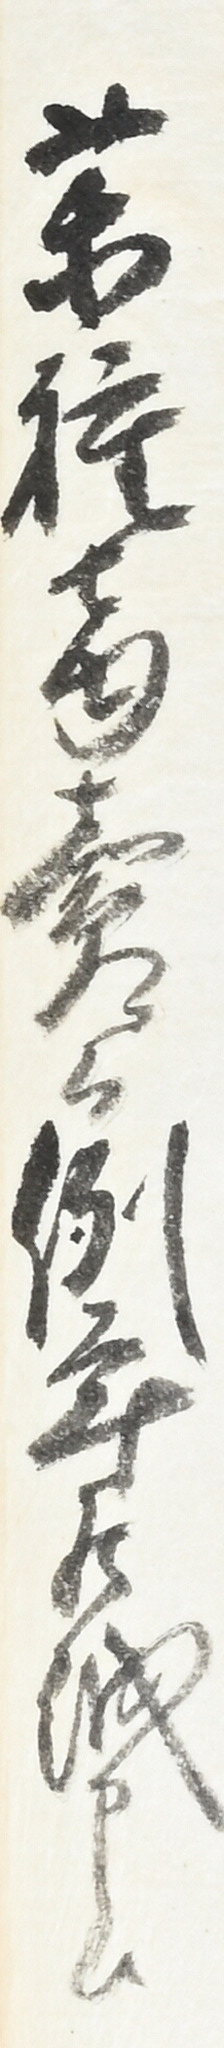薬種商売ニ而例年罷越申候
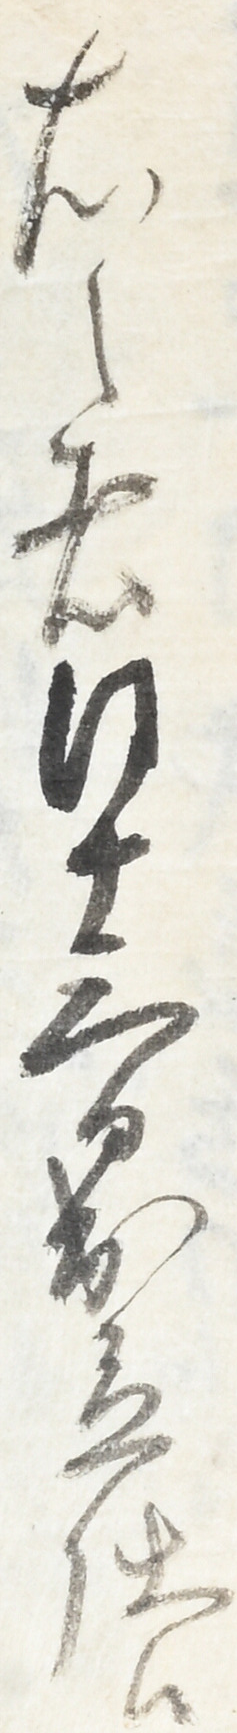右之者共同十日出立仕候

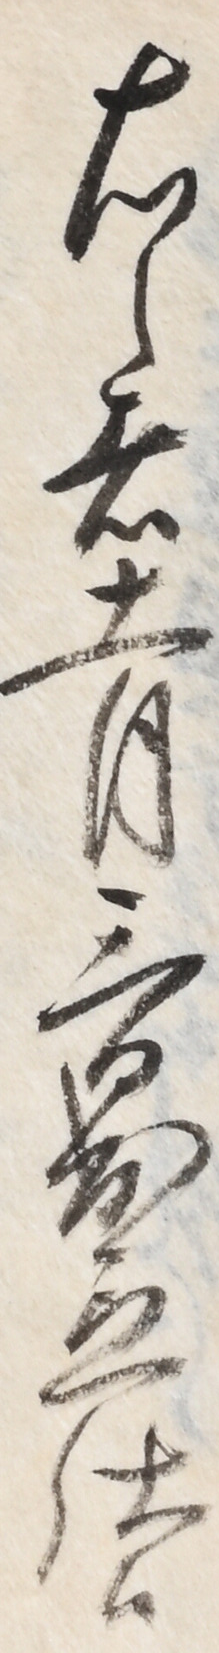右之者同十三日出立仕候
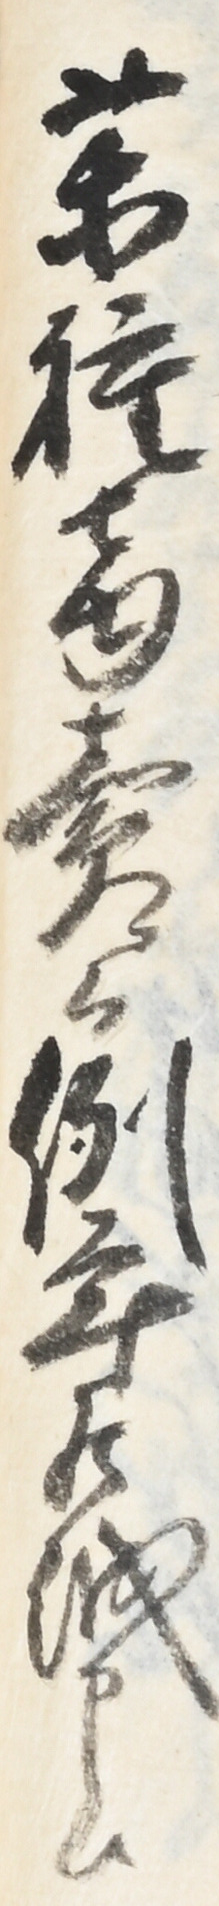薬商売ニ而例年罷越申候
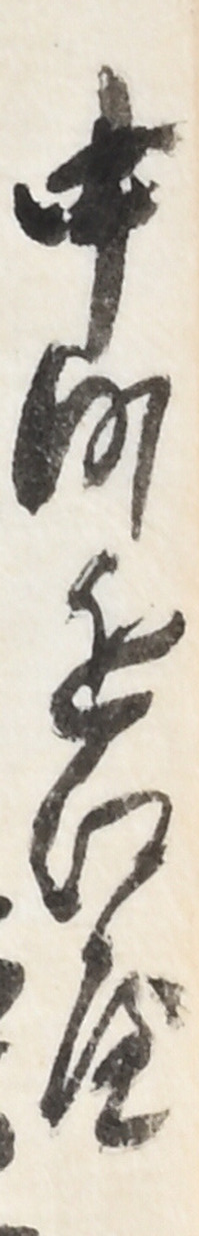中町近江屋
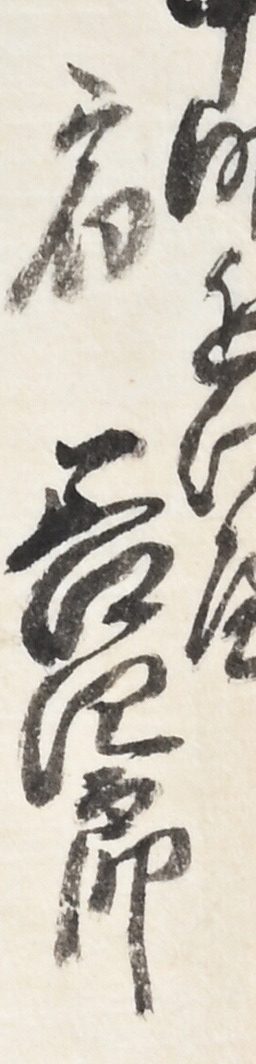宿善四郎
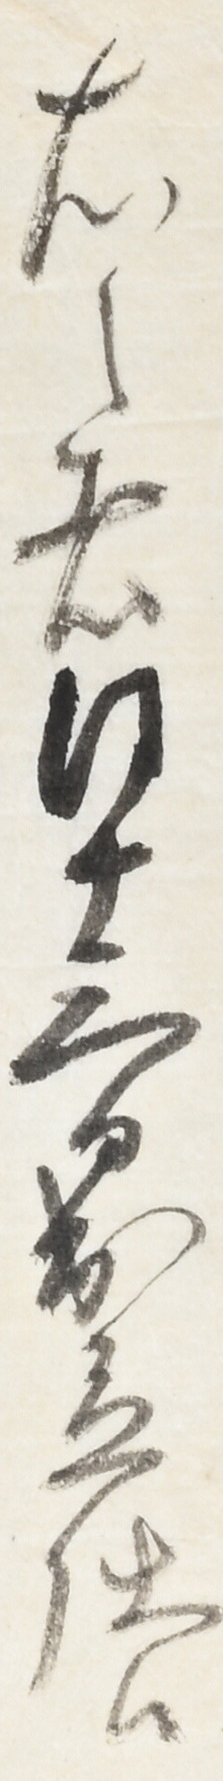右之者同十三日出立仕候
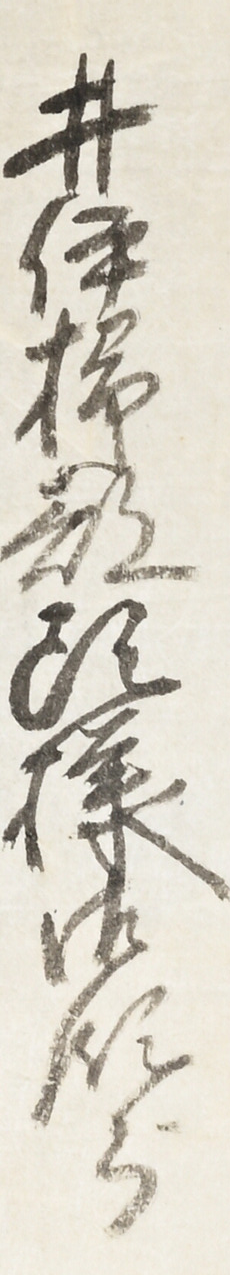井伊掃部頭様御領分
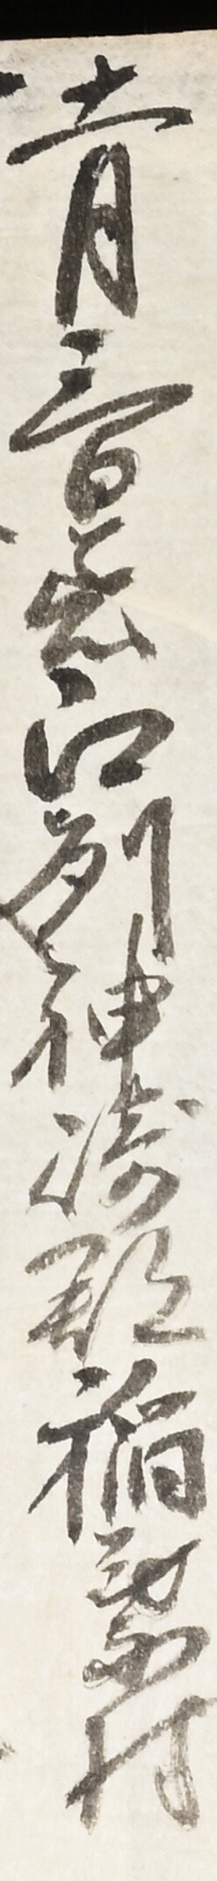十一月三日着江州神崎郡稲葉村
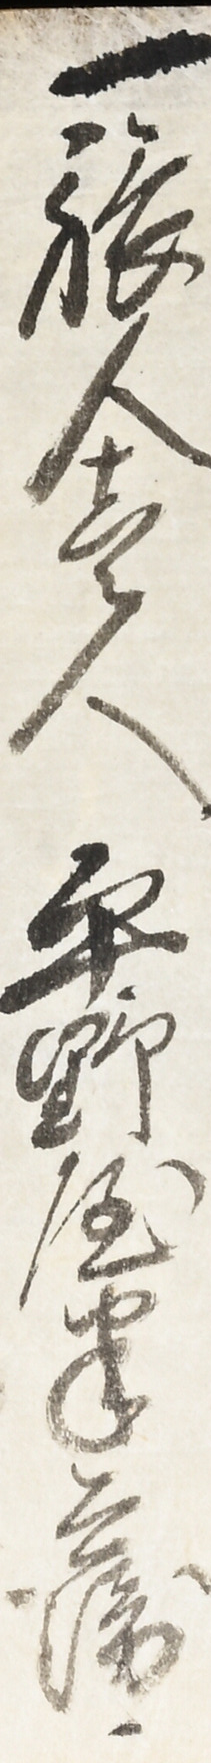一旅人壱人平野屋半兵衛・
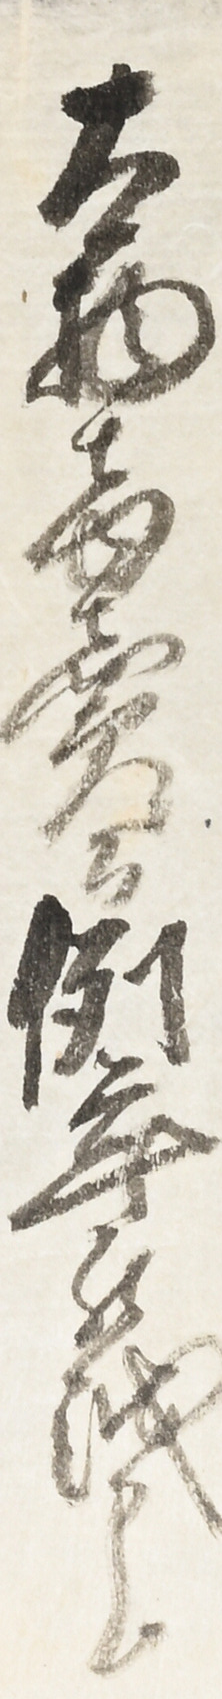太物商売ニ而例年罷越申候
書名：旅人泊控帳
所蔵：伊那市立高遠町図書館・合同会社AMANE
